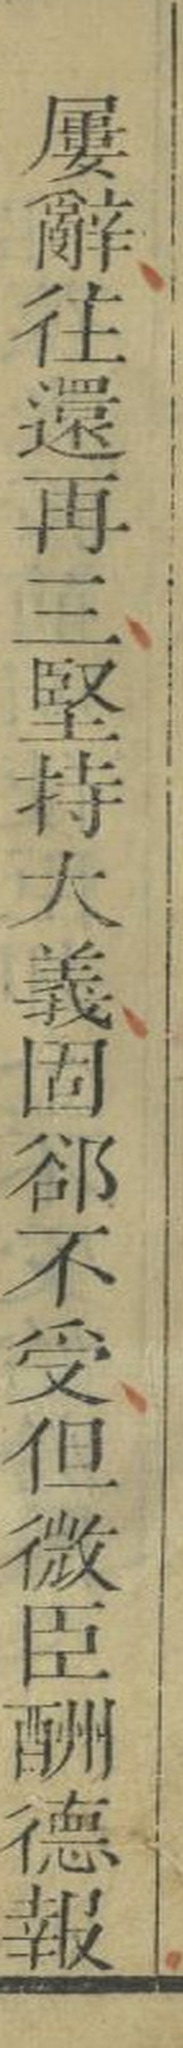屢辭往還再三堅持大義固郤不受但微臣酬德報
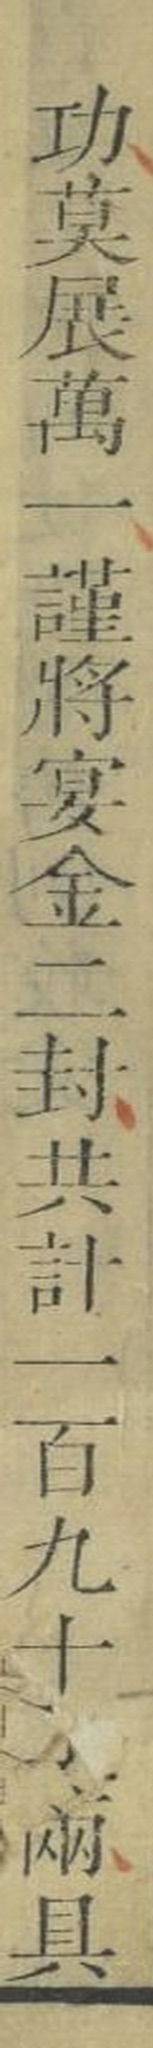功莫展萬一謹將宴金二封共計一百九十二兩具
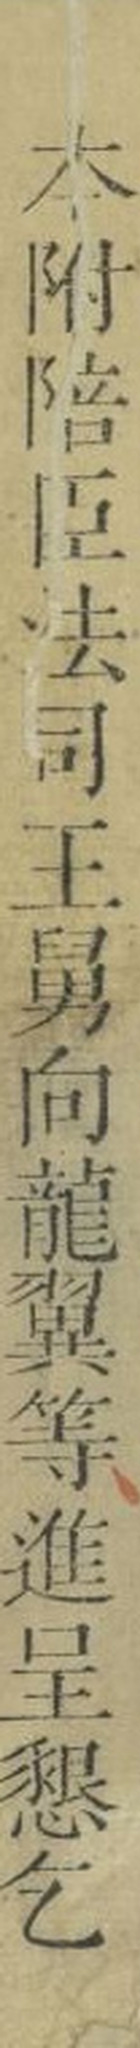本附陪臣法司王舅向龍翼等進呈懇乞
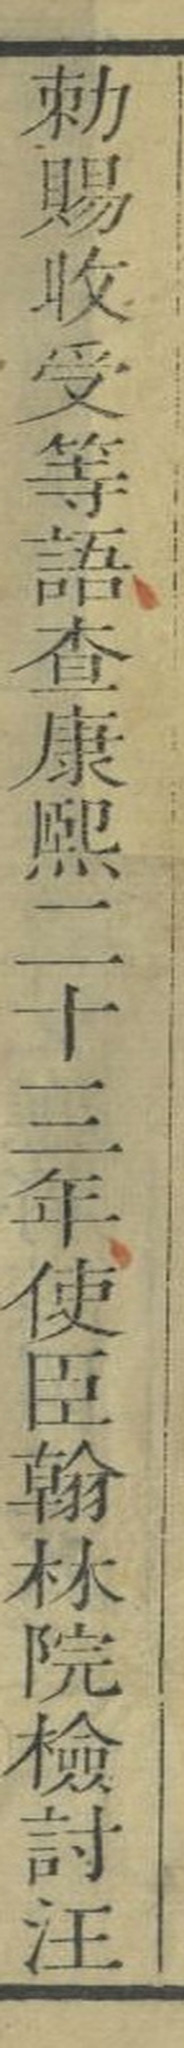勅賜收受等語査康煕二十三年使臣翰林院檢討汪
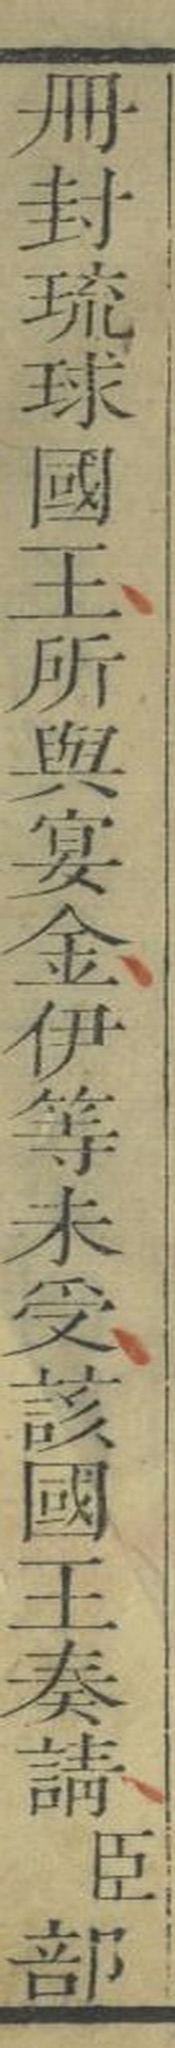冊封琉球國王所與宴金伊等未受該國王奏請臣部
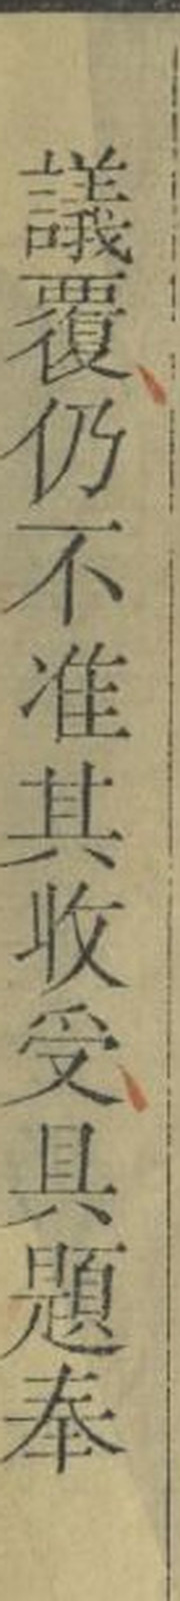議覆仍不准其收受具題奉

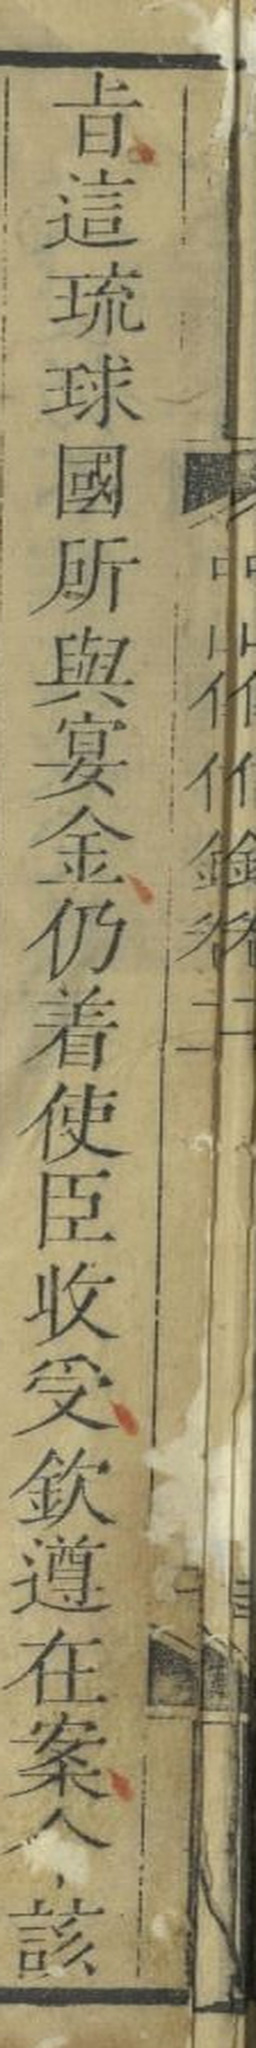㫖這琉球國所與宴金仍着使臣收受欽遵在案今該
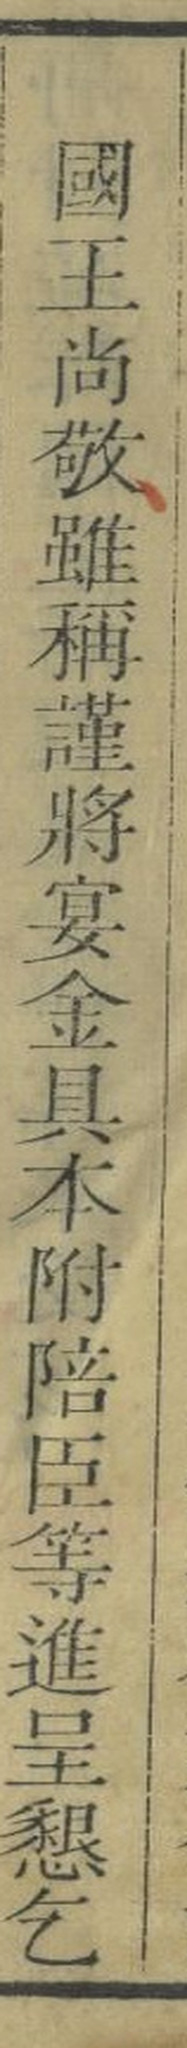國王尚敬雖稱謹將宴金具本附陪臣等進呈懇乞
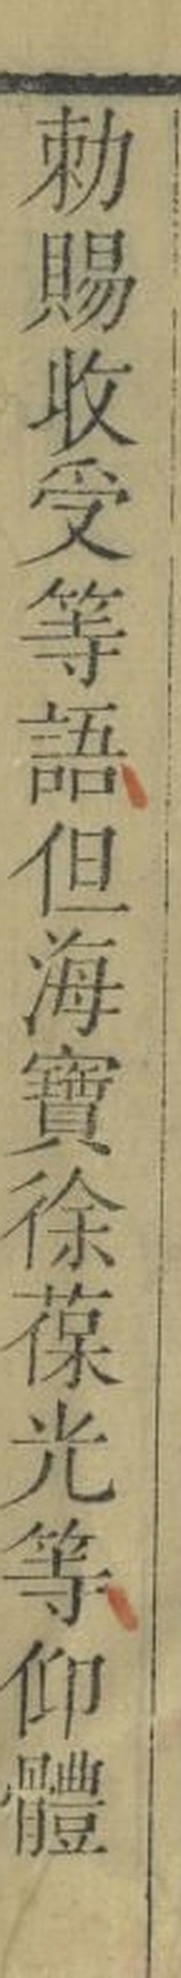勅賜收受等語但海寶徐葆光等仰體
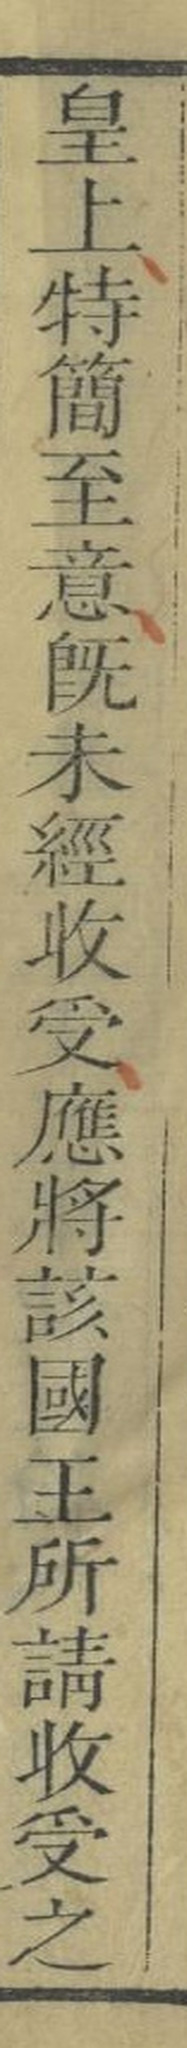皇上特簡至意既未經收受應將該國王所請收受之
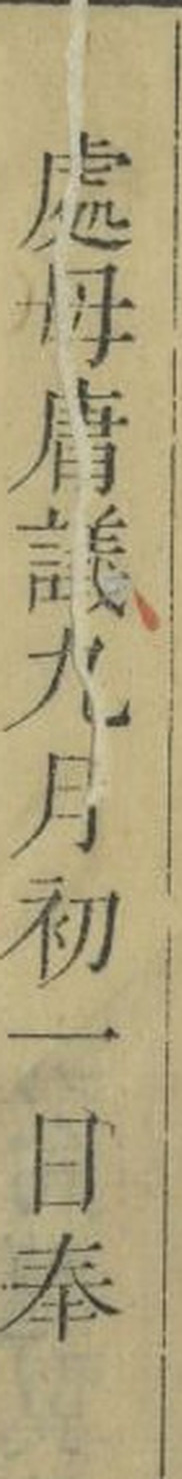處母庸議九月初一日奉
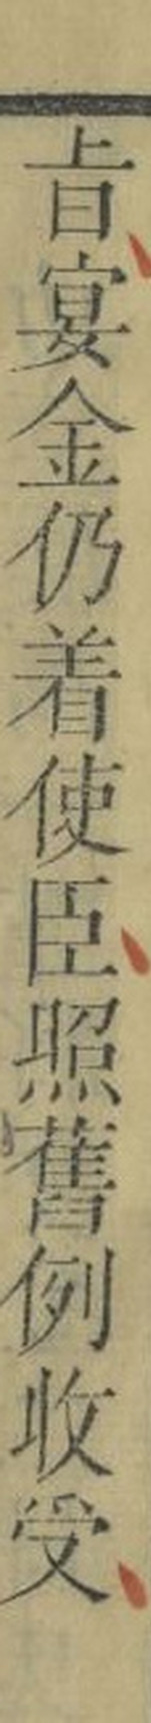㫖宴金仍着使臣照舊例收受
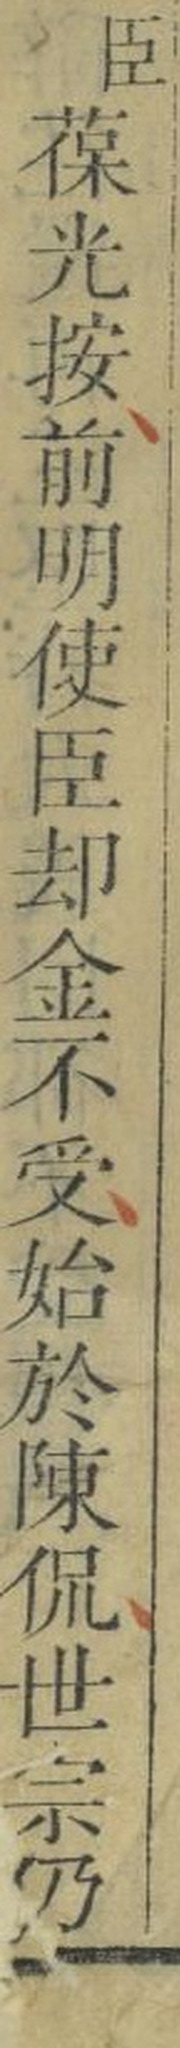臣葆光按前明使臣却金不受始於陳侃世宗仍
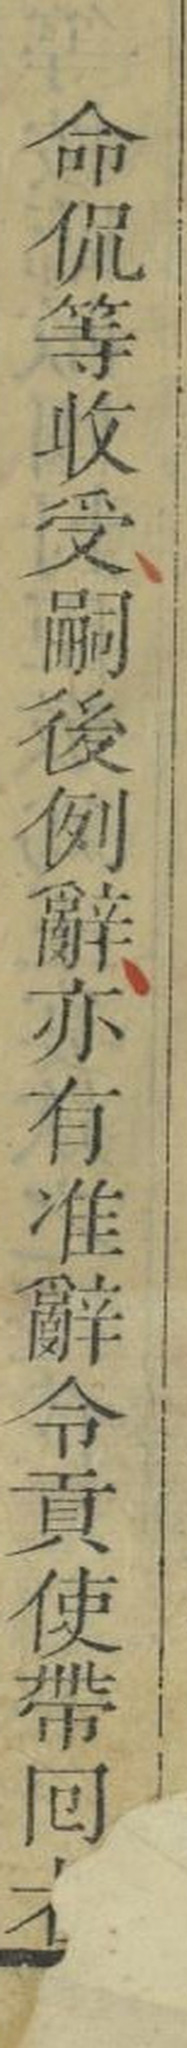命侃等收受嗣後例辭亦有准辭令貢使帶囘者
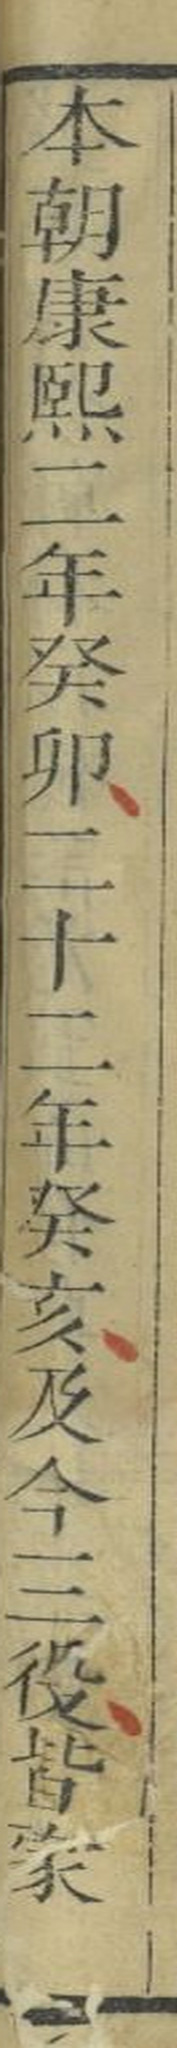本朝康熙二年癸卯二十二年癸亥及今三役皆蒙
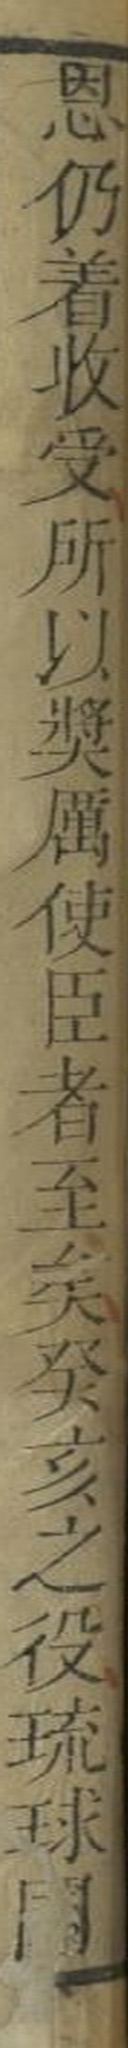恩仍着收受所以奬厲使臣者至矣癸亥之役琉球國
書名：中山伝信録 巻一、巻二
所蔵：University of the Ryukyus Library
